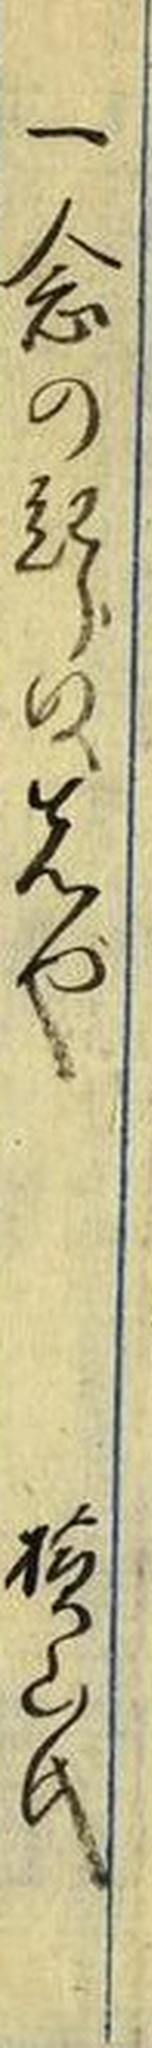一念の起らぬ先や横山氏
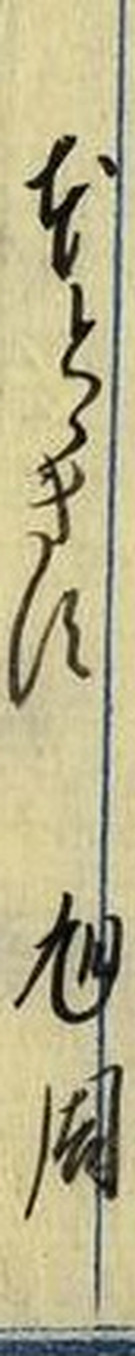ほとゝきす旭周
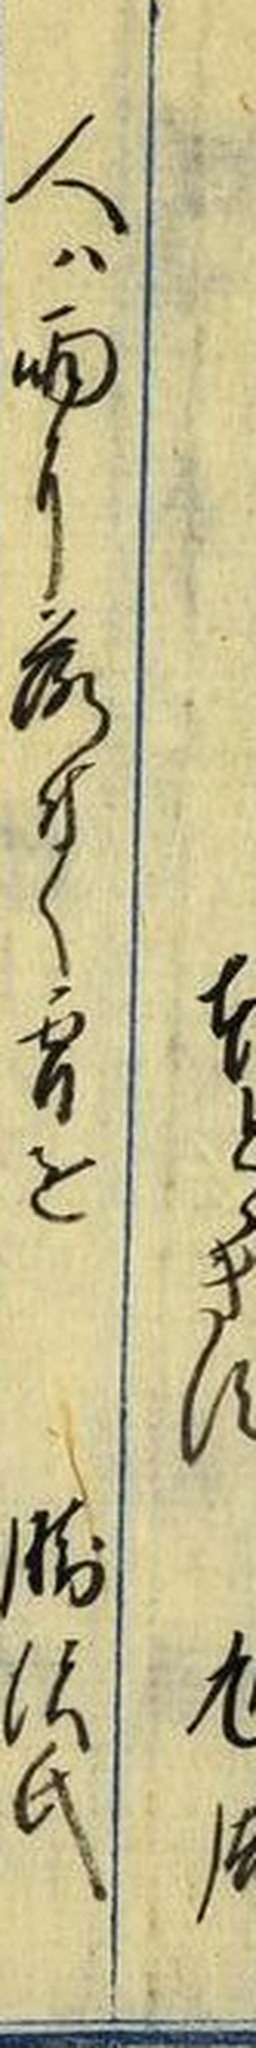人は雨に落付く雪を勝沢氏
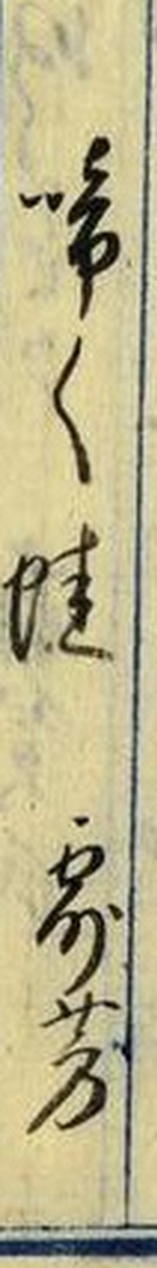啼く蛙露芳
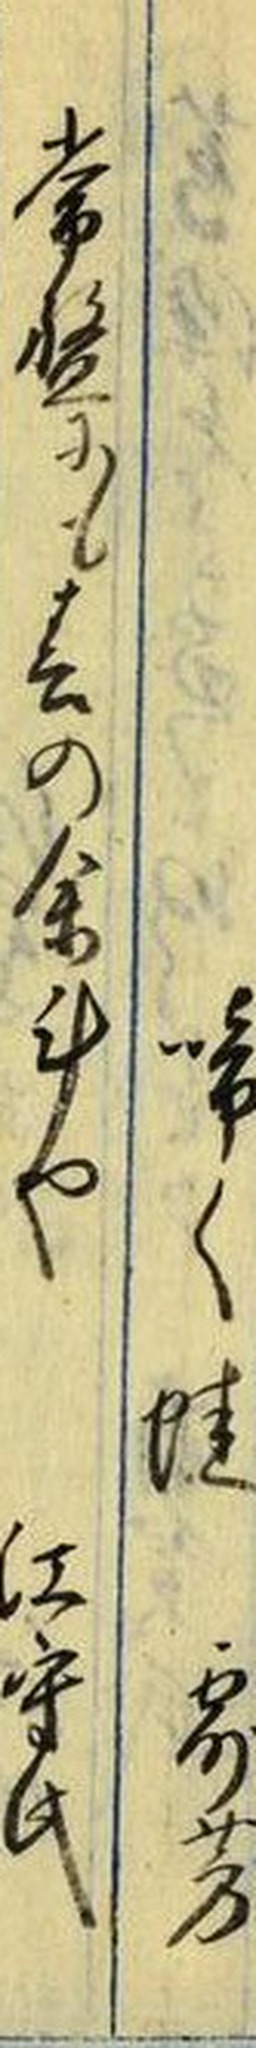常盤にも春の余計や江守氏
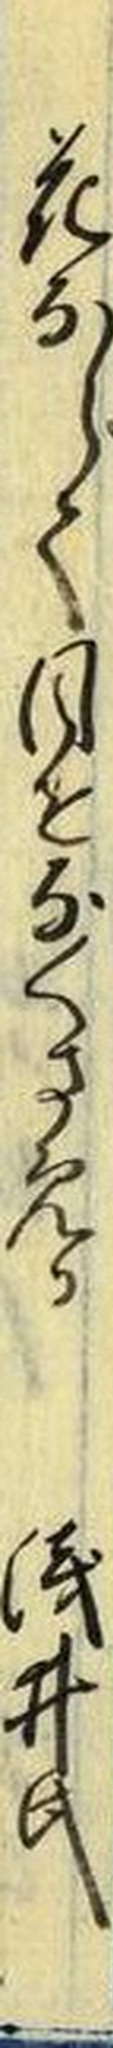花ならて目をなくさめり浅井氏
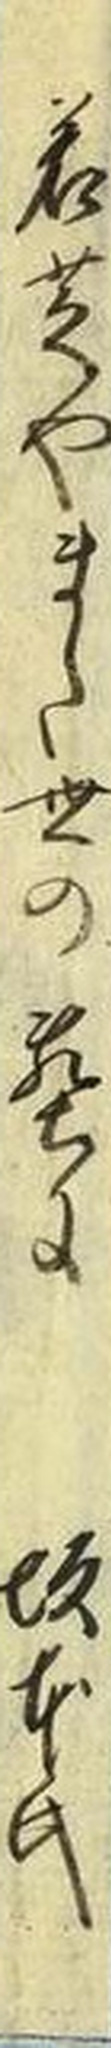若芝やまた世の塵に坂本氏
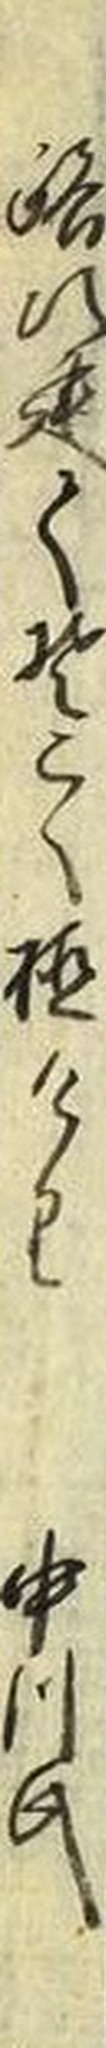露路建てそこへ植けり中川氏
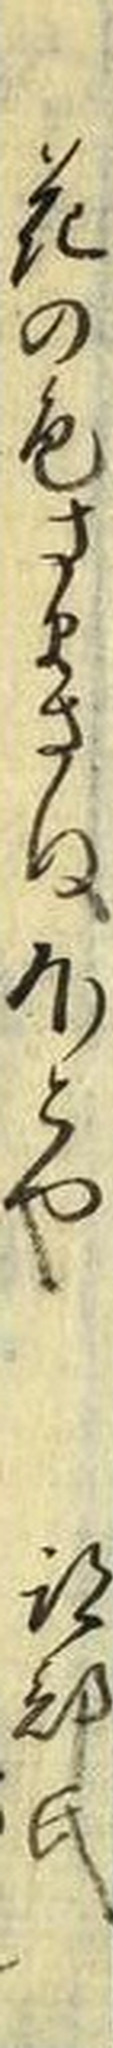花の色さまさぬほとや跡部氏

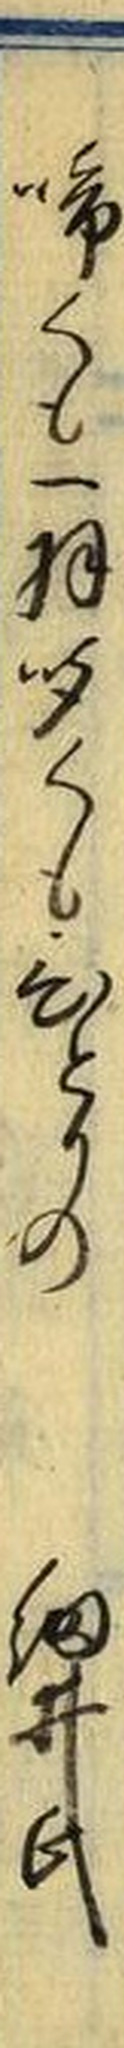啼くも一羽聞くもひとりの細井氏
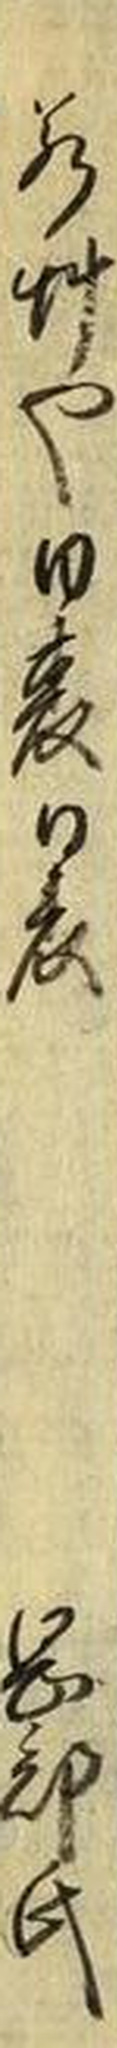若竹や日裏日表岡部氏
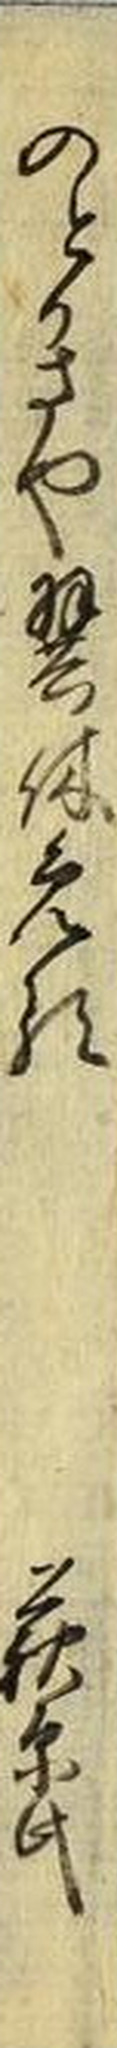のとかさや翼休める萩原氏
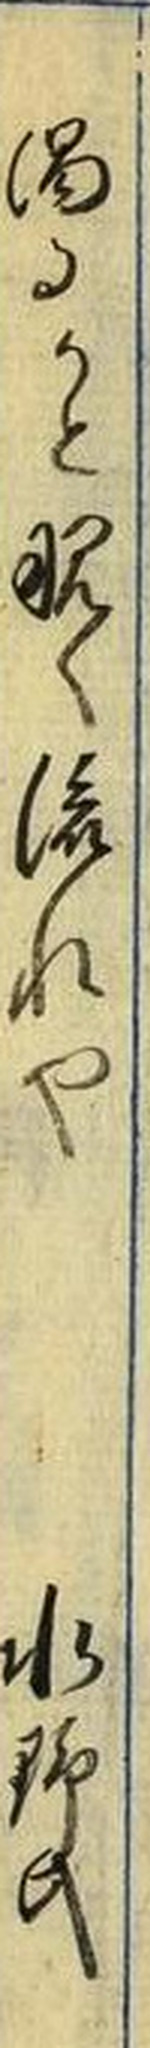濁るかと覗く流れや水野氏
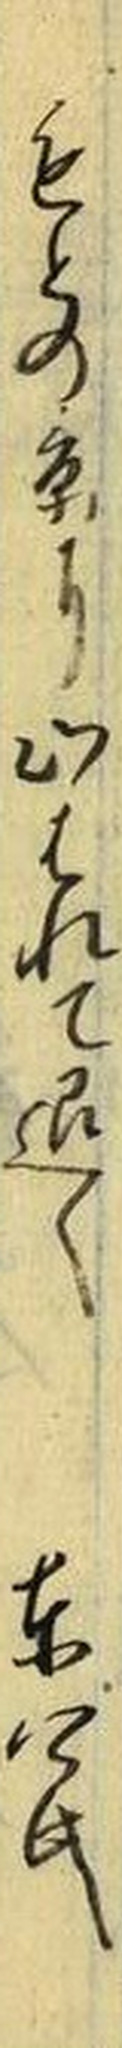もとの景に山はれて退く東郷氏
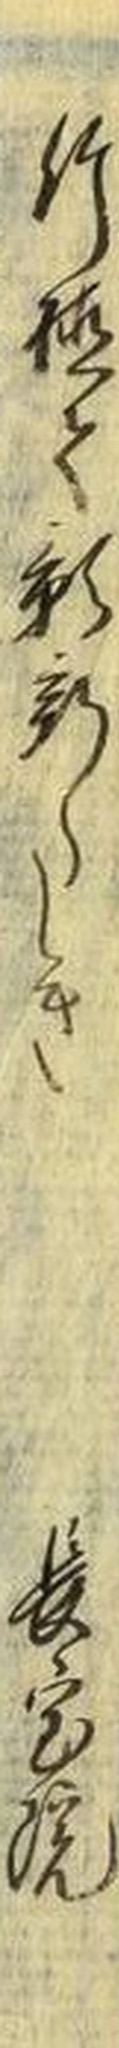竹植て影新しき長宝院
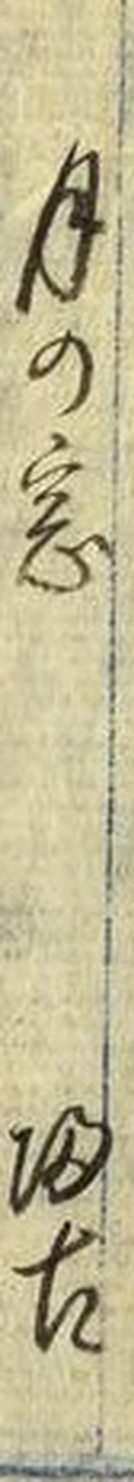月の窓帰古
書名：温古集 三巻
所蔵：福井県文書館 Fukui Prefectural Archives
